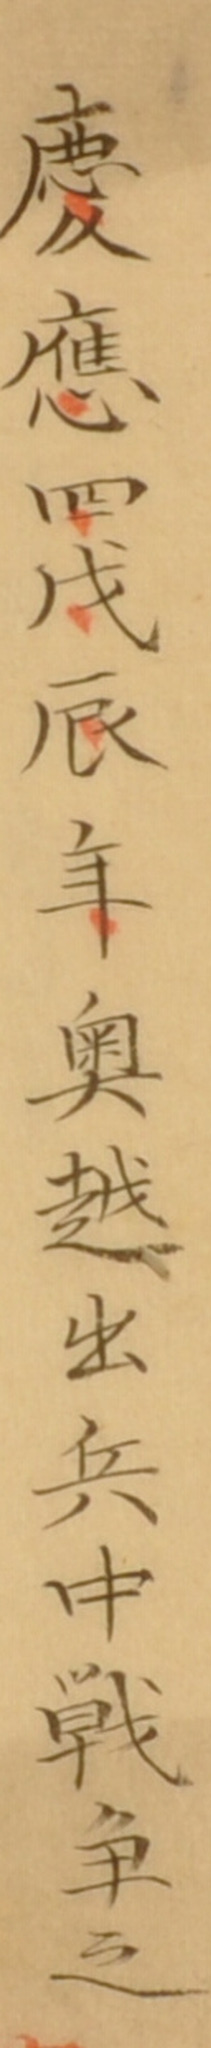慶応四戊辰年奥越出兵中戦争之控
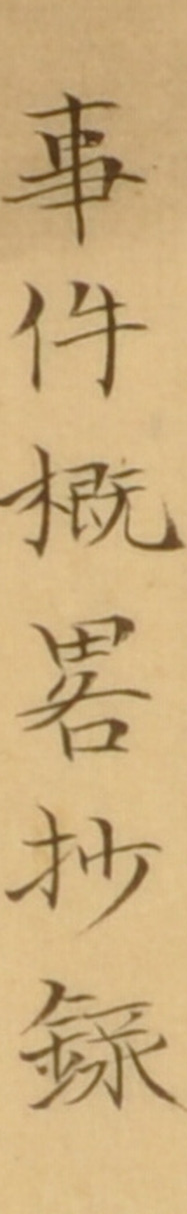事件概略抄録

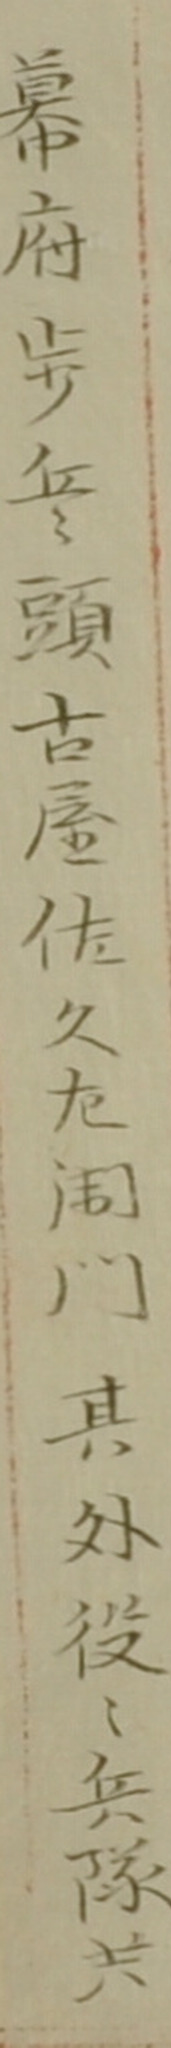幕府歩兵頭古屋佐久左衛門其外役々兵隊共
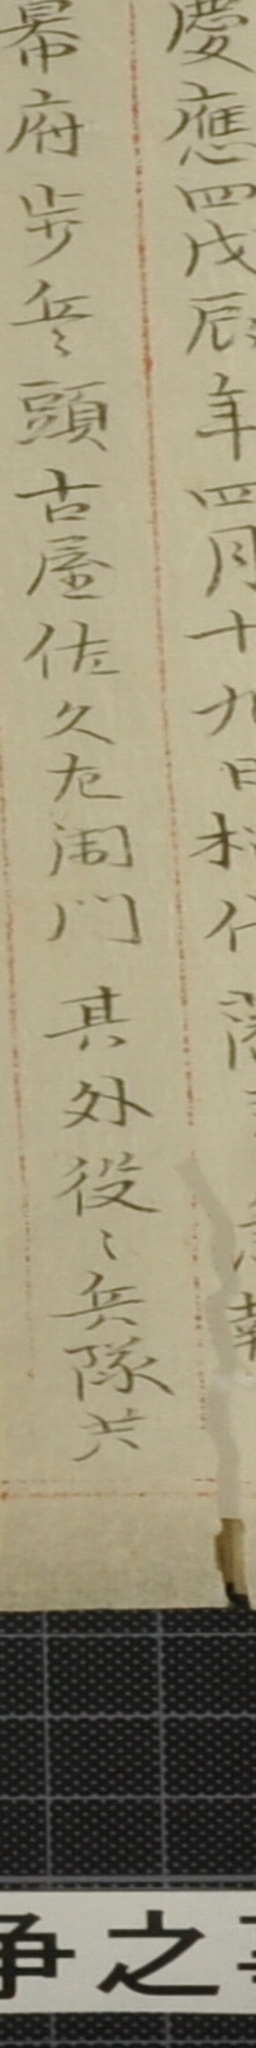幕府歩兵頭古屋佐久左衛門其外役々兵隊共
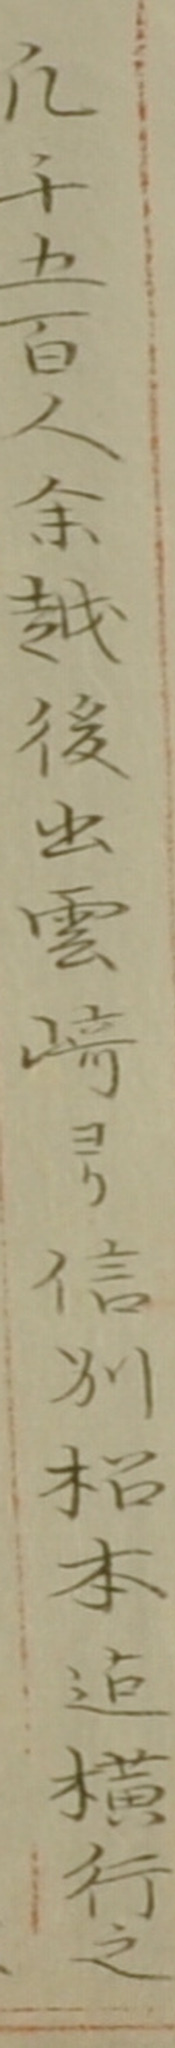凡千五百人余越後出雲﨑ヨリ信州松本迄横行之
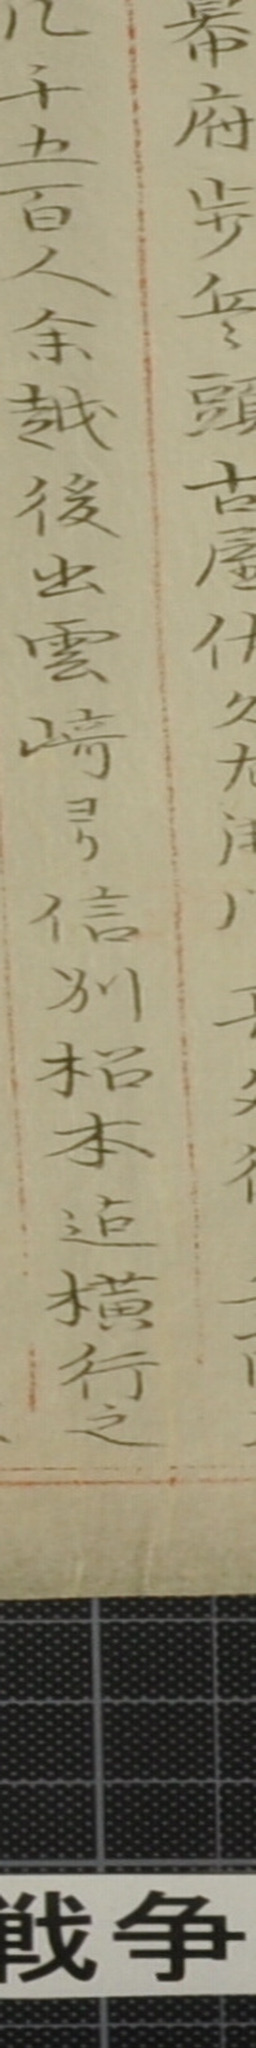凡千五百人余越後出雲﨑ヨリ信州松本迄横行之
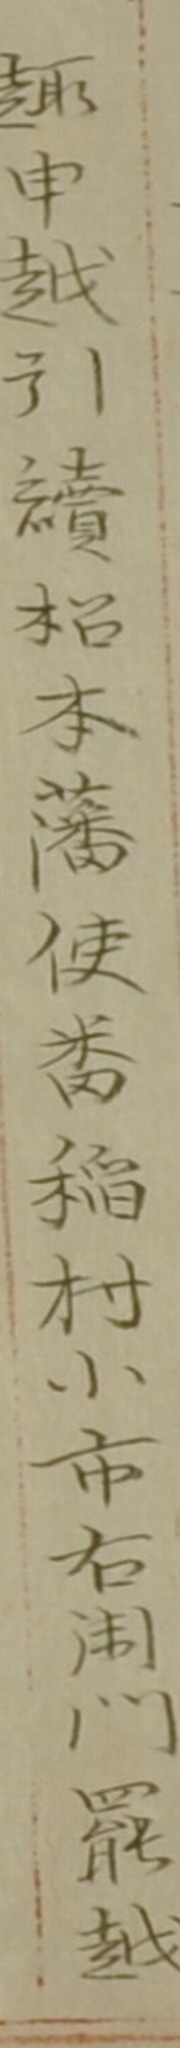趣申越引続松本藩使番稲村小市右衛門罷越
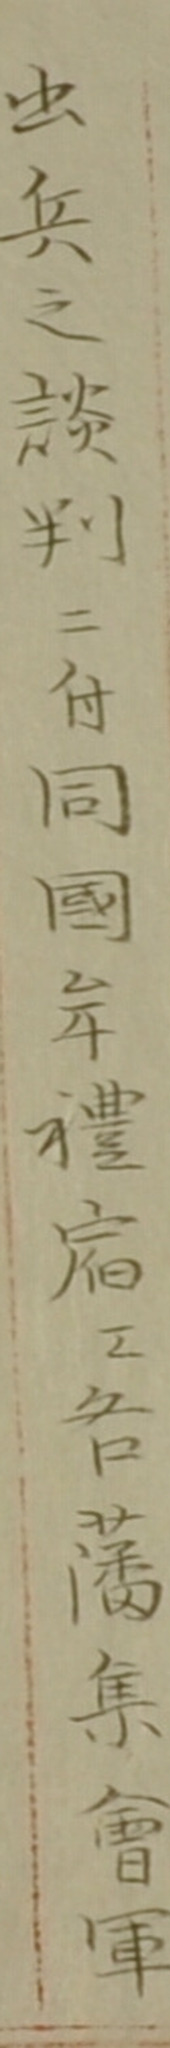出兵之談判ニ付同国牟禮宿エ各藩集会軍
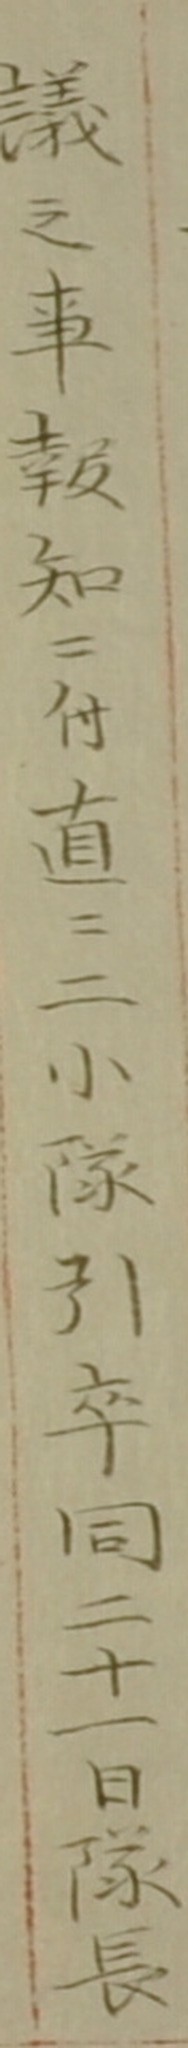議之事報知ニ付直ニ二小隊引卒同二十一日隊長
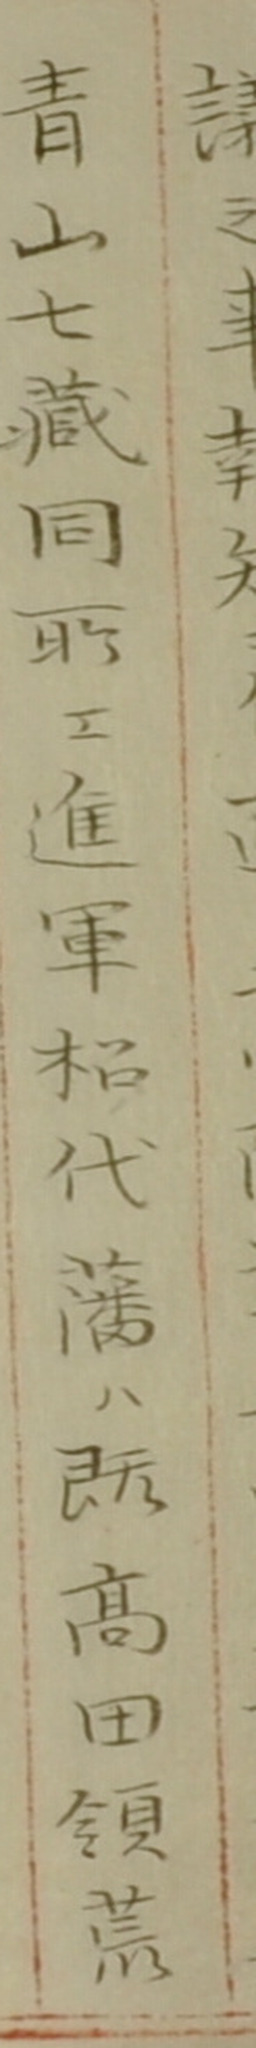青山七蔵同所エ進軍松代藩ハ既髙田領荒
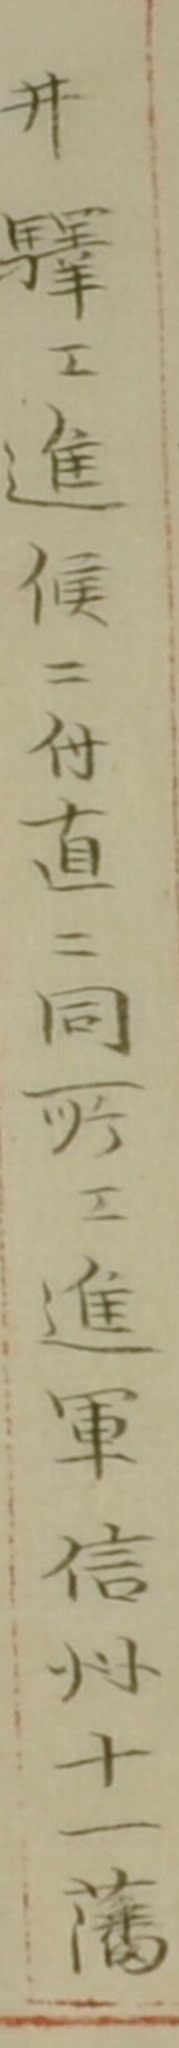井駅エ進侯ニ付直ニ同所エ進軍信州十一藩
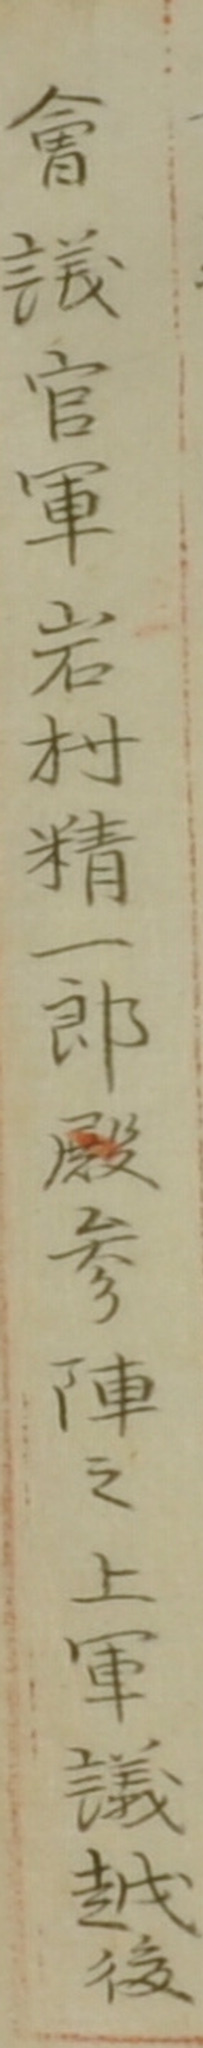会議官軍岩村精一郎殿参陣之上軍議越後
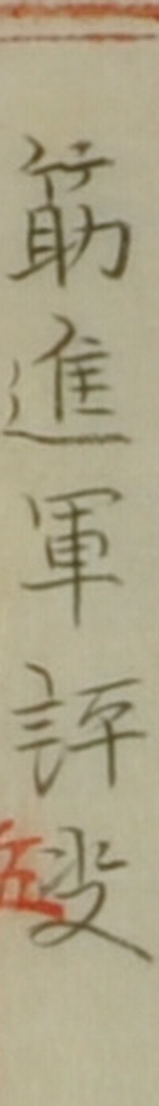筋進軍評決
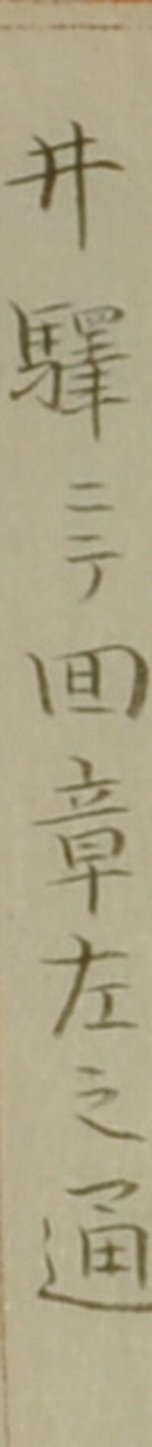井駅ニテ回章左之通
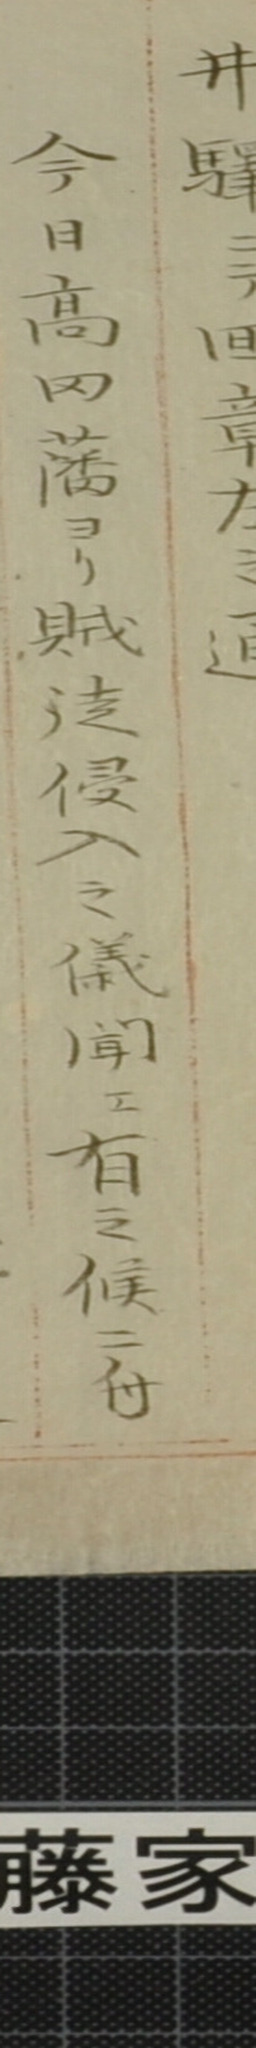今日髙田藩ヨリ賊徒侵入之儀聞エ有之候ニ付
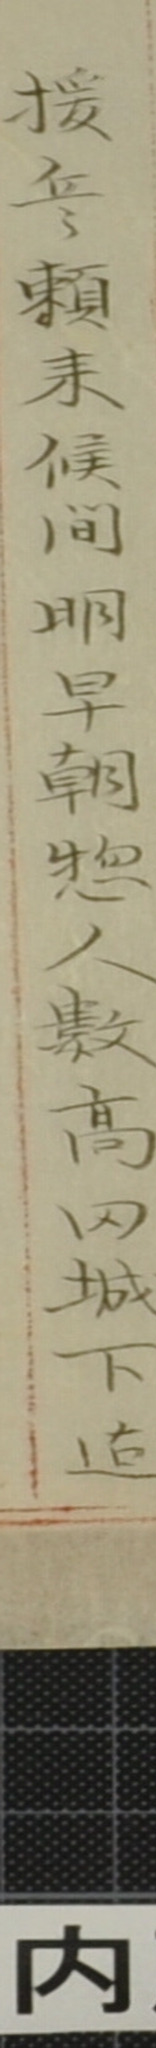援兵頼来候間明早朝惣人数髙田城下迄
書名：奥越出兵中戦争之事件概略抄録（控）
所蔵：伊那市立高遠町図書館・合同会社AMANE
